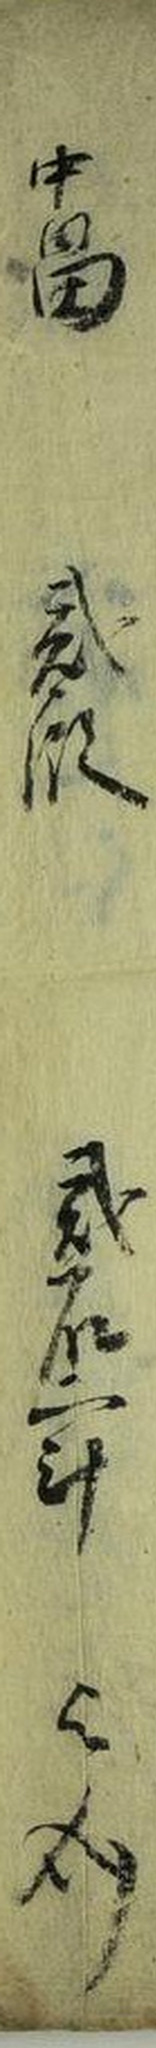中畠弐段弐石二斗与介
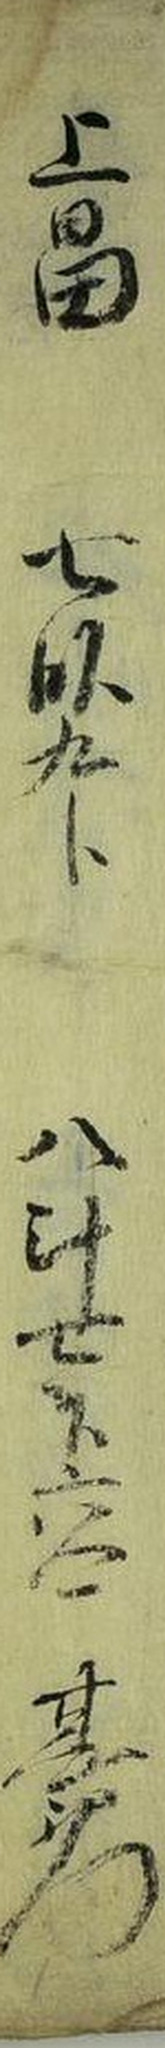上畠七畝九歩八斗七升六合甚右衛門
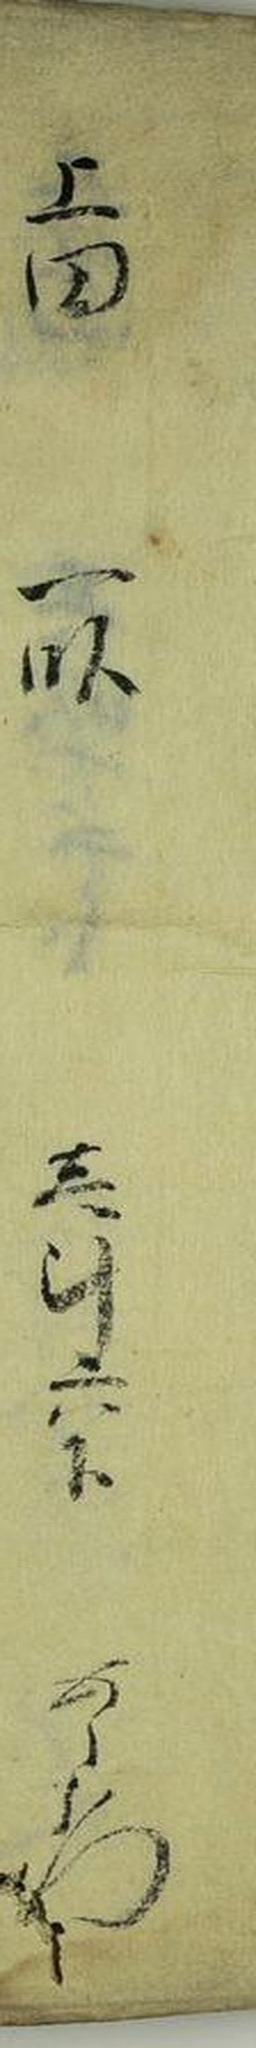上田壱畝壱斗六升五郎左衛門
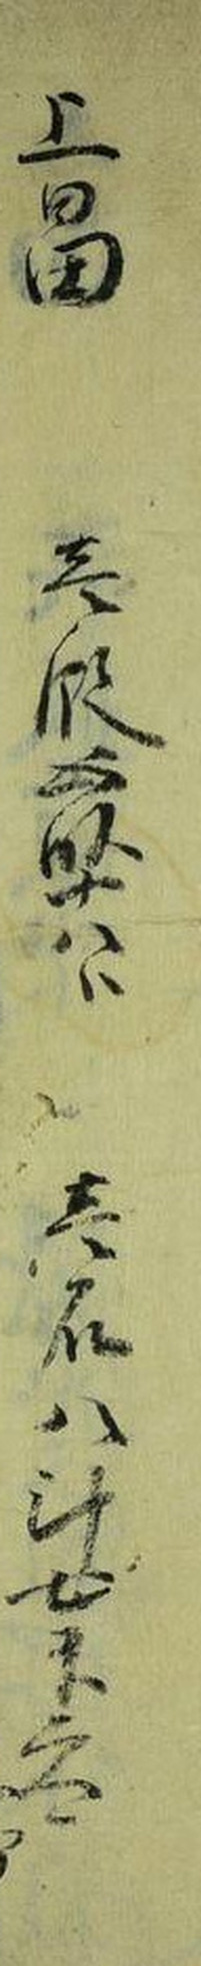上畠壱段五畝十八歩壱石八斗七升二合甚四郎
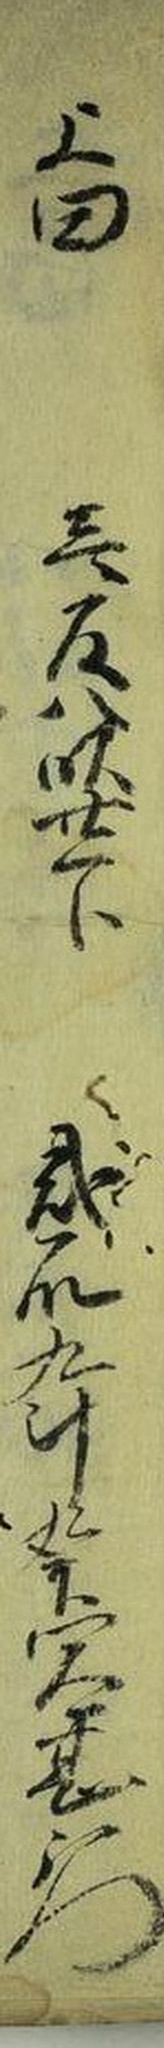上田壱反八畝廿一歩弐石九斗九升四合甚右衛門
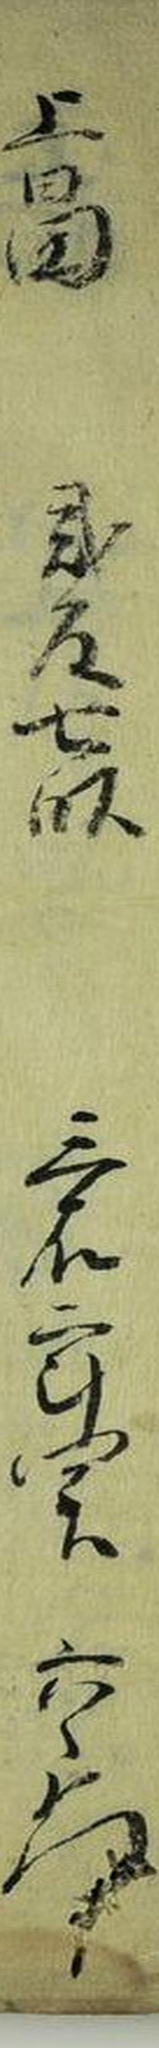上畠弐反七畝三石二斗四升六郎右衛門尉
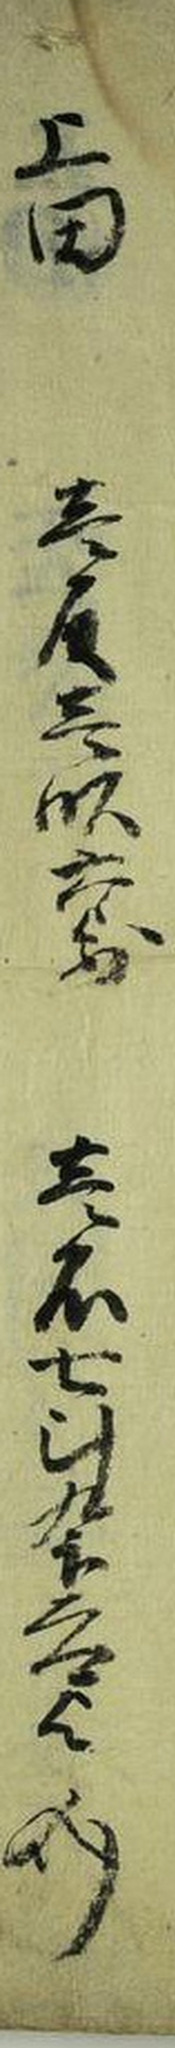上田壱反壱畝六歩壱石七斗九升二合与介
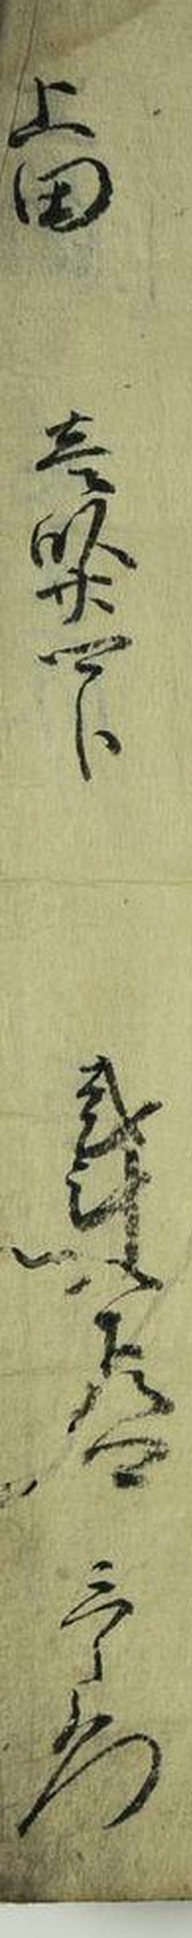上田壱畝廿四歩弐斗八升八合三郎右衛門

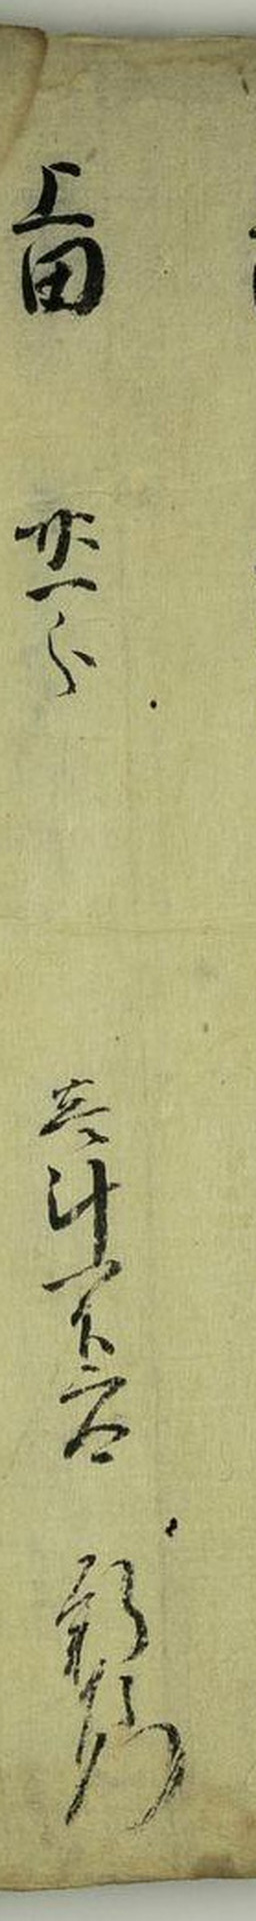上田廿一歩壱斗一升二合新左衛門
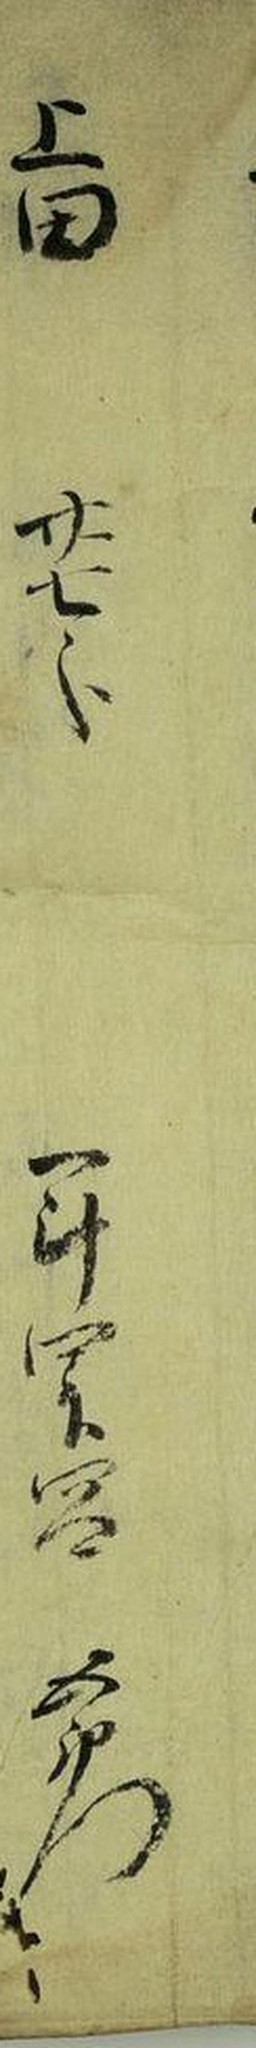上田廿七歩壱斗四升四合五右衛門
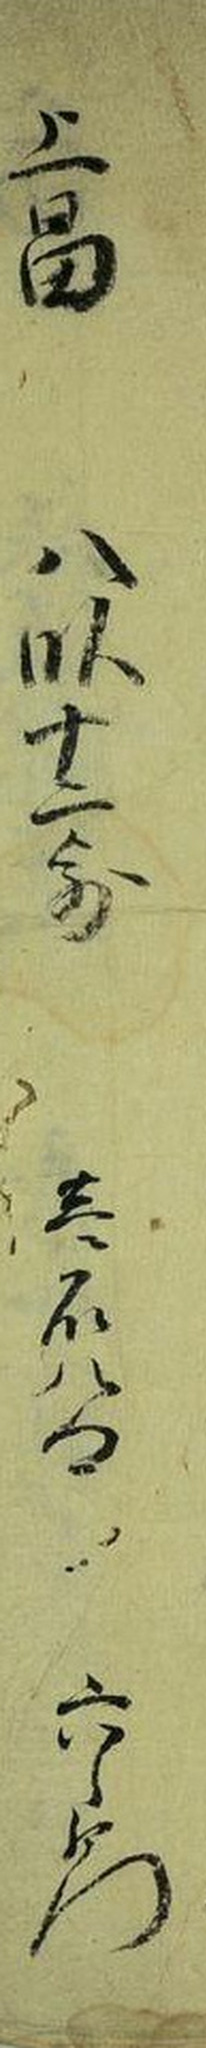上畠八畝十二歩壱石八合六郎右衛門
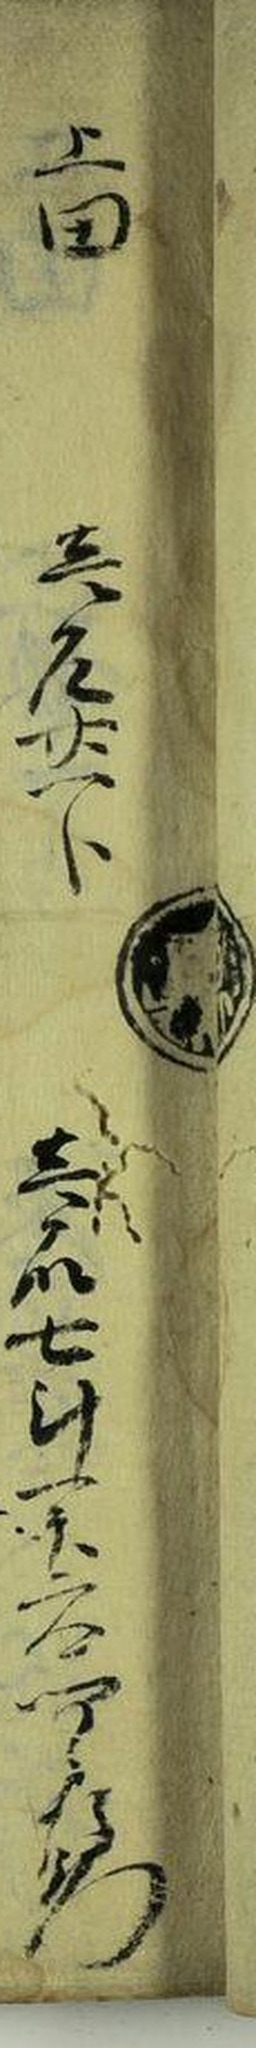上田壱反廿一歩壱石七斗一升二合四郎左衛門
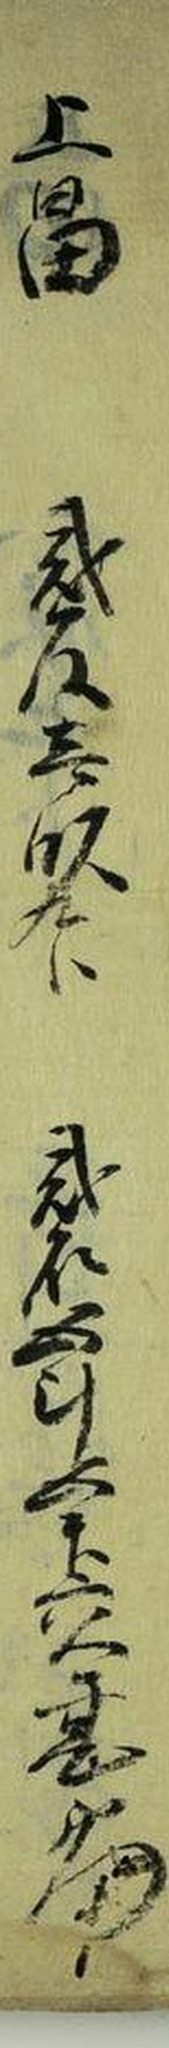上畠弐反壱畝九歩弐石五斗五升六合甚右衛門
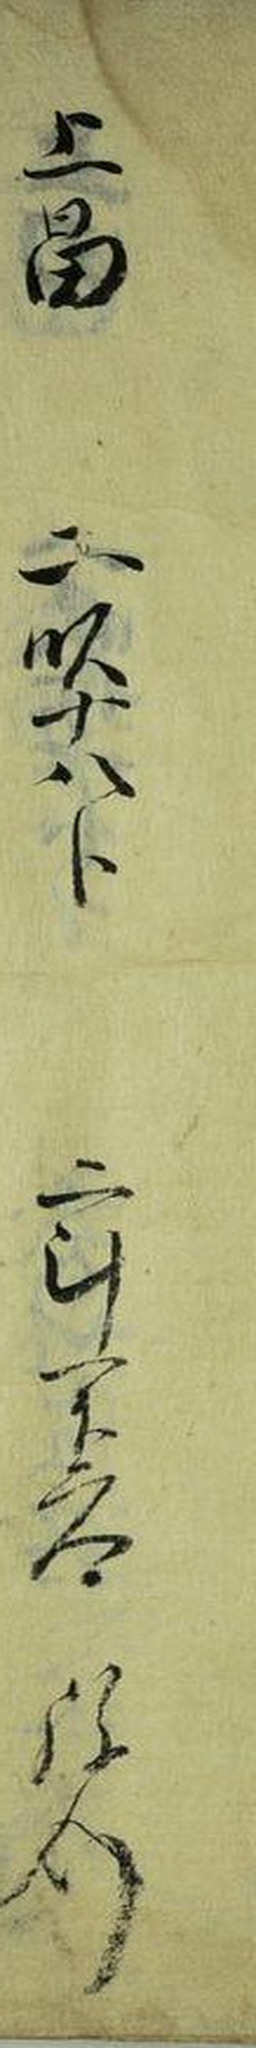上畠二畝十八歩二斗一升二合弥介
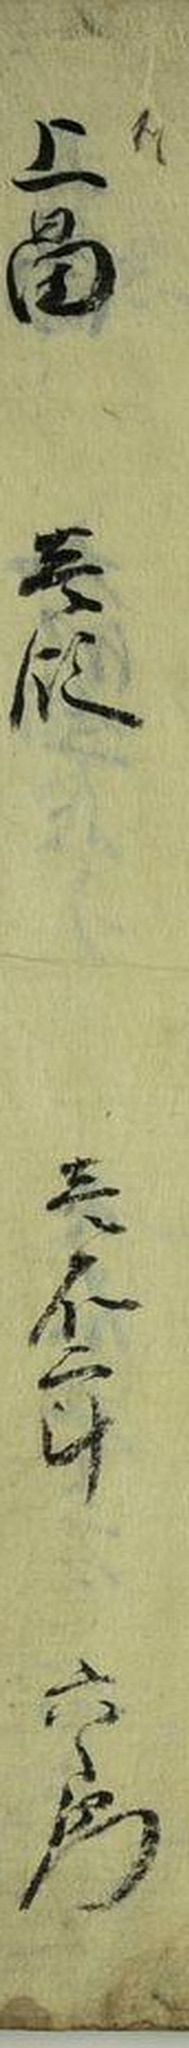上畠壱段壱石二斗六郎右衛門

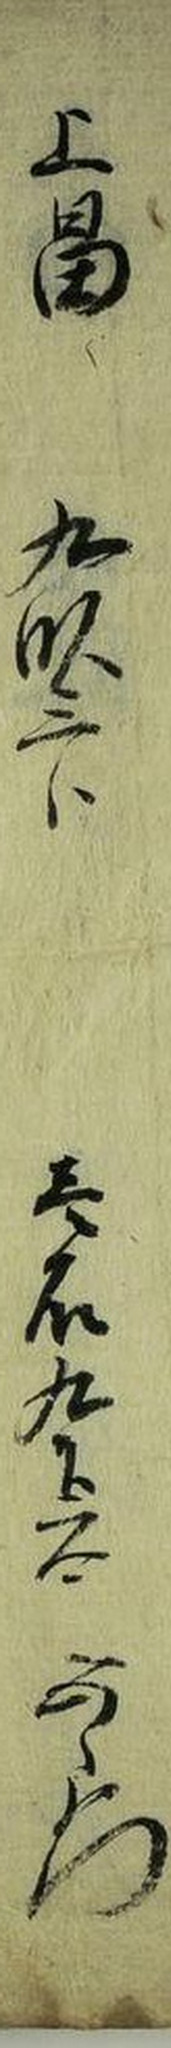上畠九畝三歩一石九升二合五郎右衛門
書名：越前国中墨郡安沢村水帳（太閤検地帳）
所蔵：福井県文書館 Fukui Prefectural Archives
